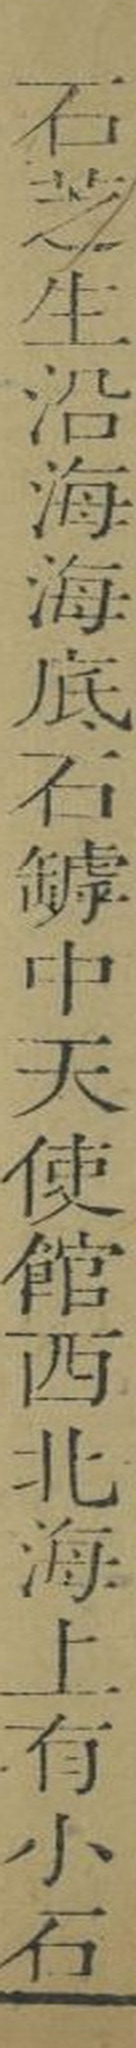石芝生沿海海底石罅中天使館西北海上有小石
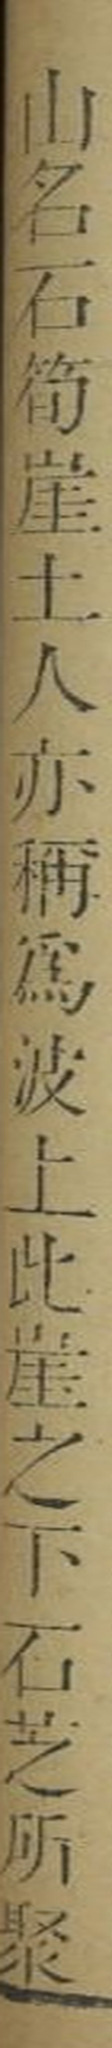山名石筍崖土人亦称為波上此崖之下石芝所聚
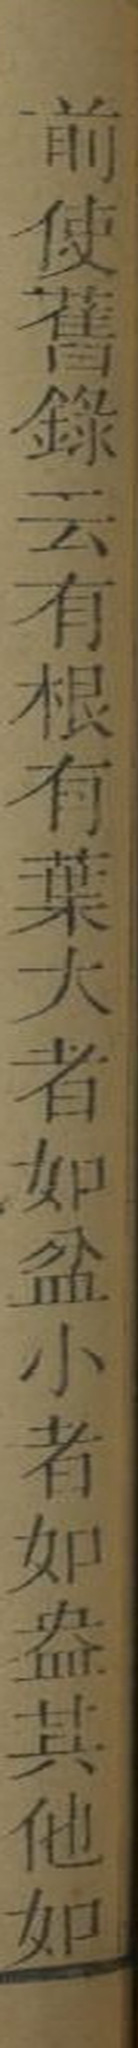前使旧録云有根有葉大者如盆小者如盎其他如
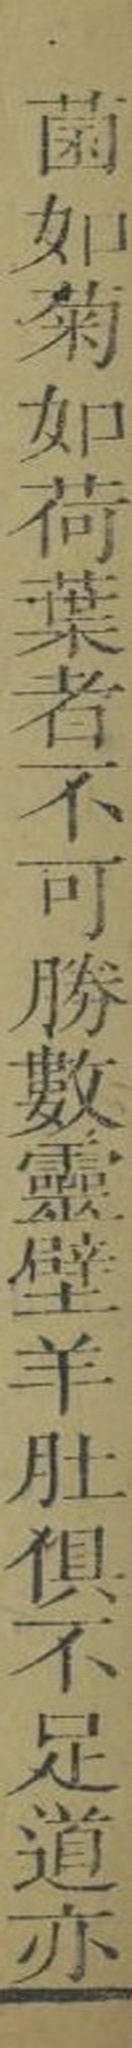菌如菊如荷葉者不可勝数霊壁羊肚俱不足道亦
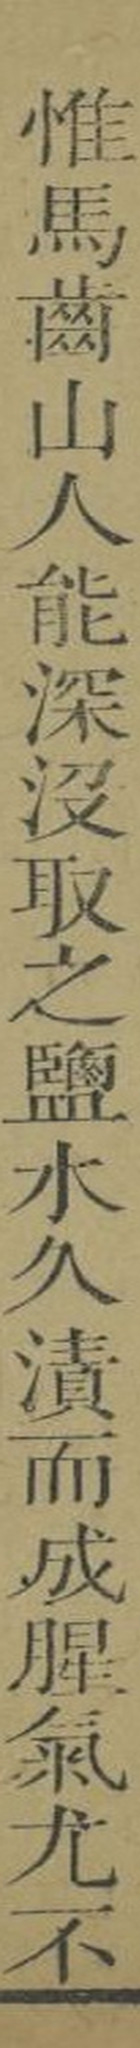惟馬歯山人能深没取之塩水久漬而成腥気尤不
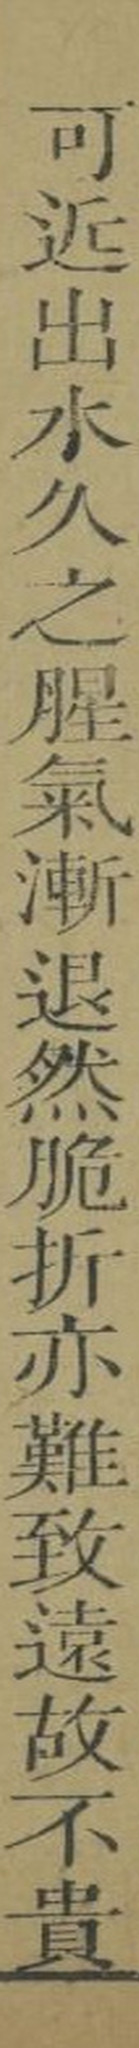可近出水久之腥気漸退然脆折亦難致遠故不貴
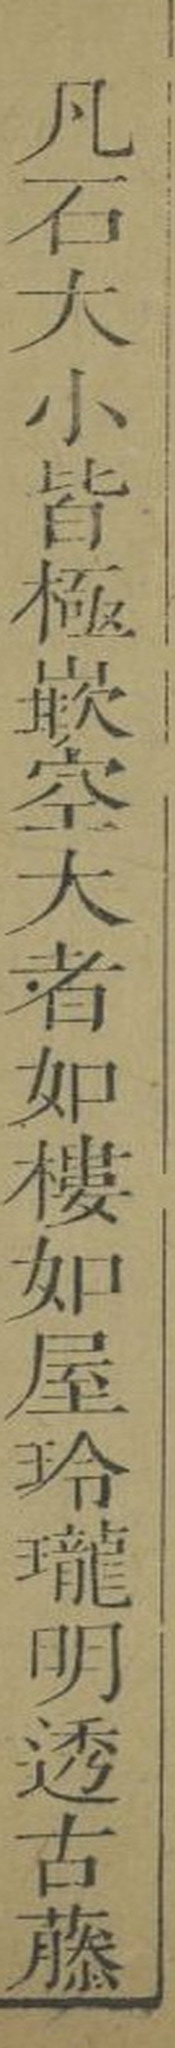凡石大小皆極嵌空大者如楼如屋玲瓏明透古藤
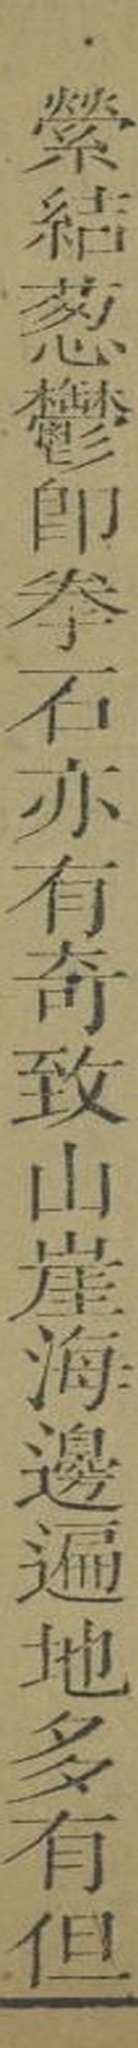縈結葱鬱即拳石亦有奇致山崖海辺遍地多有但
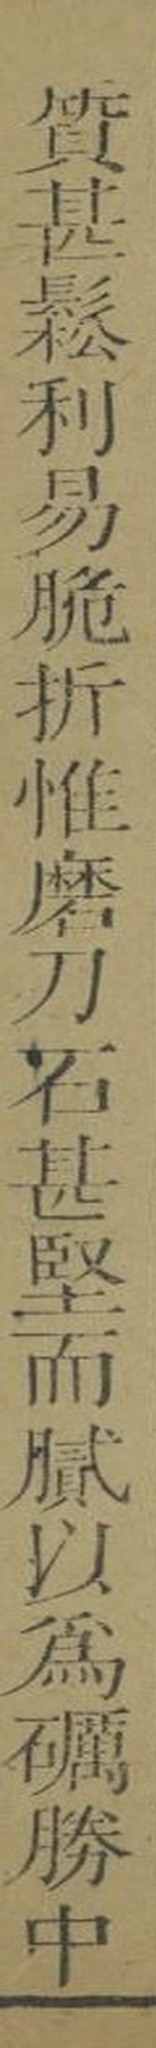質甚鬆利易脆折惟磨刀石甚堅而膩以為礪勝中
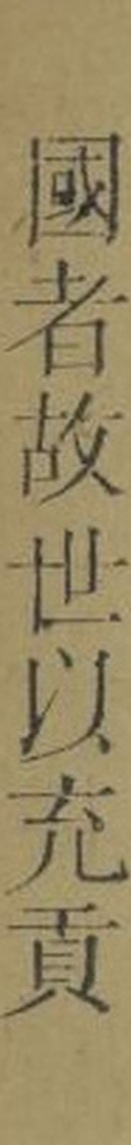国者故世以充貢

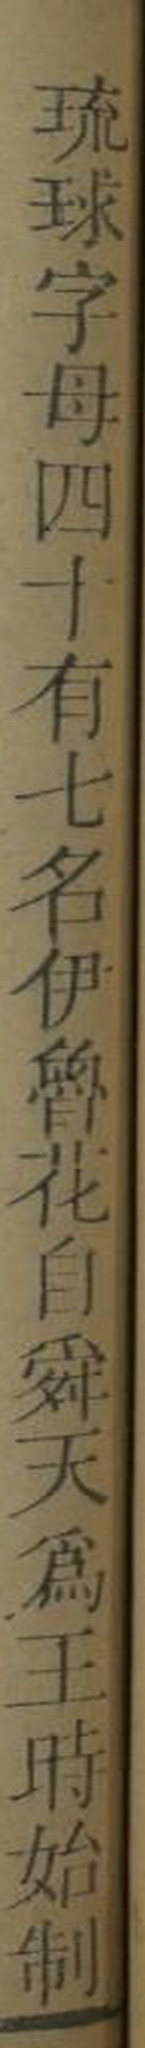琉球字母四十有七名伊魯花自舜天為王時始制
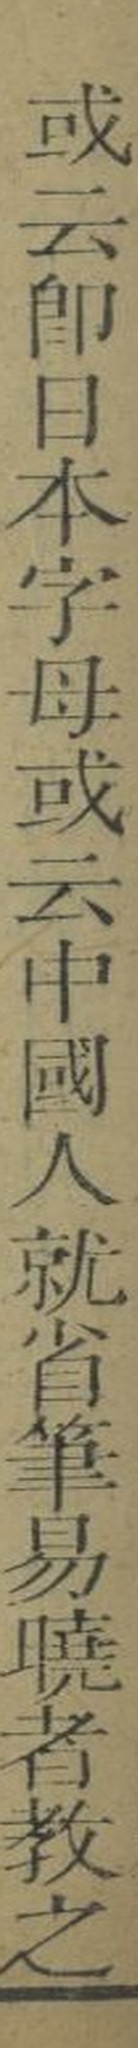或云即日本字母或云中国人就省筆易暁者教之
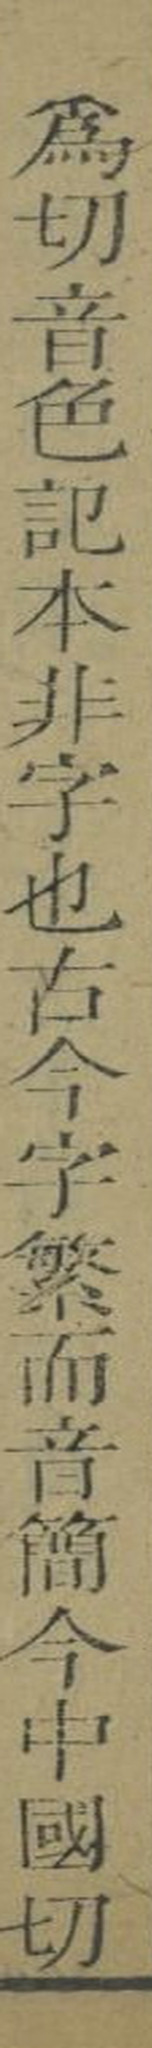為切音色記本非字也古今字繁而音簡今中国切
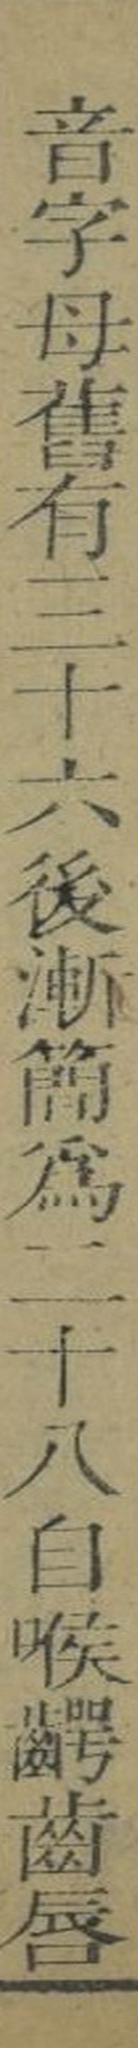音字母旧有三十六後漸簡為二十八自喉齶歯唇
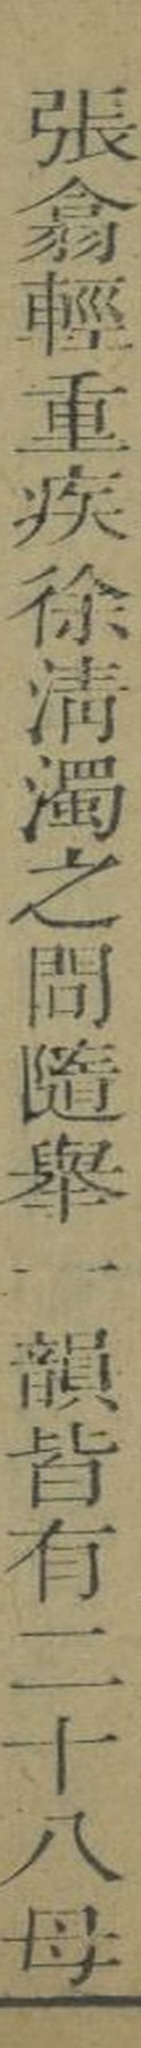張翕軽重疾徐清濁之間随挙一韻皆有二十八母
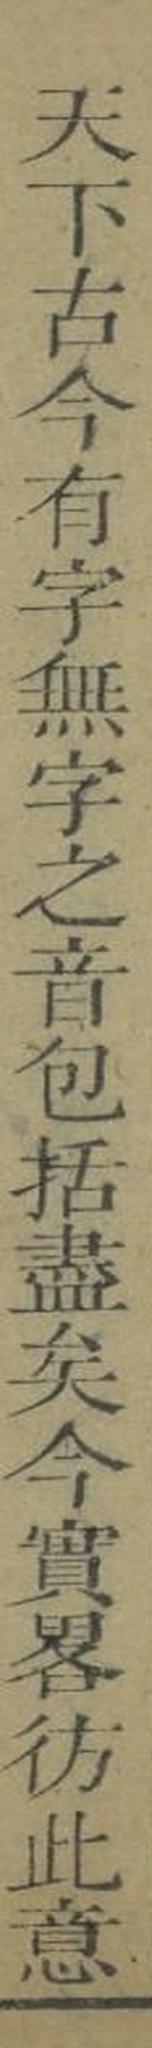天下古今有字無字之音包括尽矣今実略彷此意
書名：中山伝信録 巻六
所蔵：University of the Ryukyus Library
